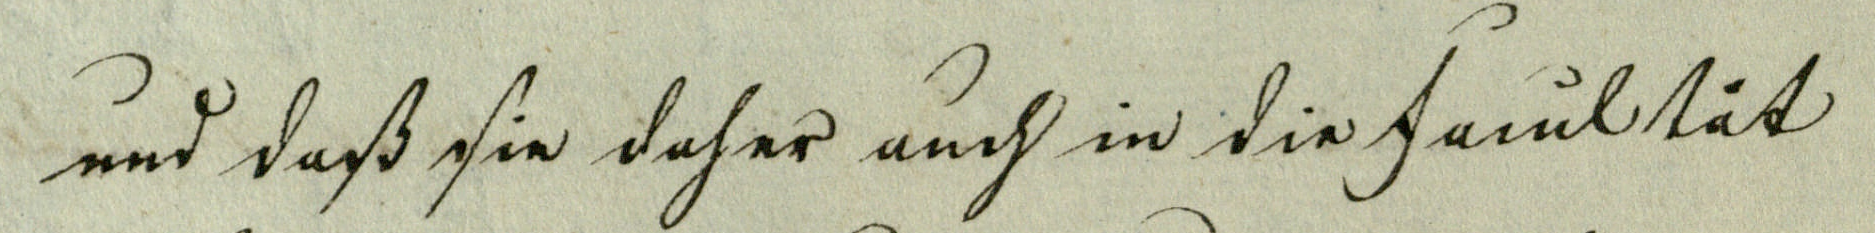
und daß sie daher auch in die Facultät
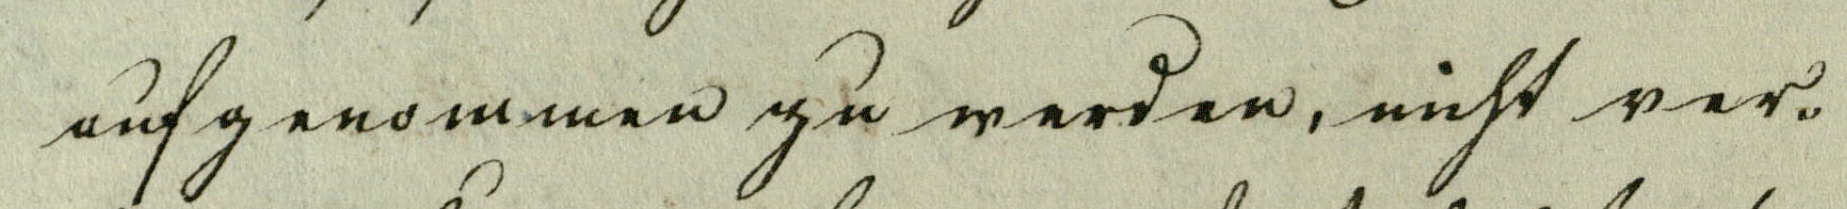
aufgenommen zu werden nicht, ver¬
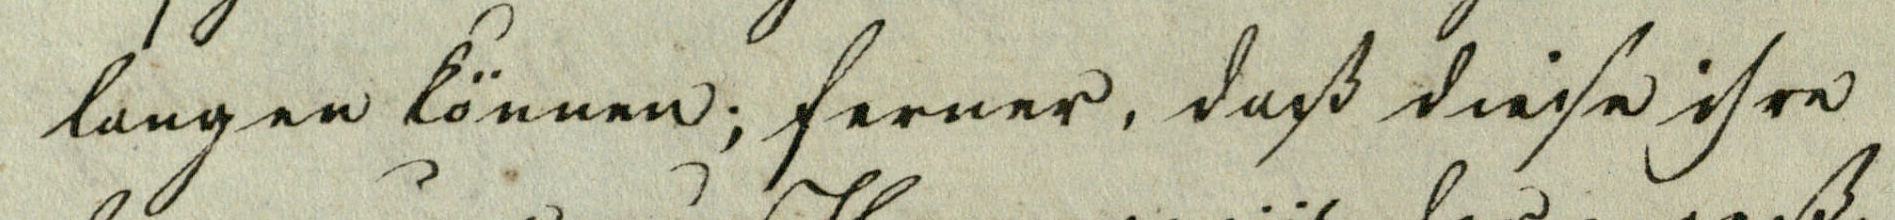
langen können; ferner, daß diese ihre
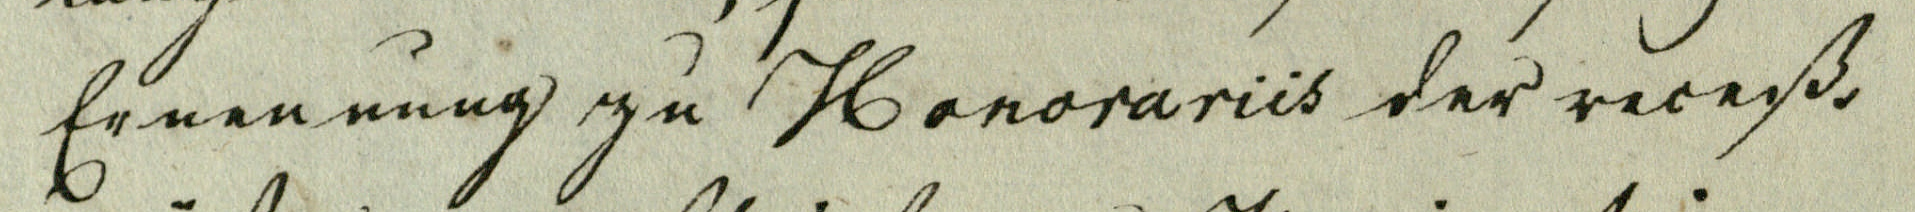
Ernennung zu Honorariis der receß¬
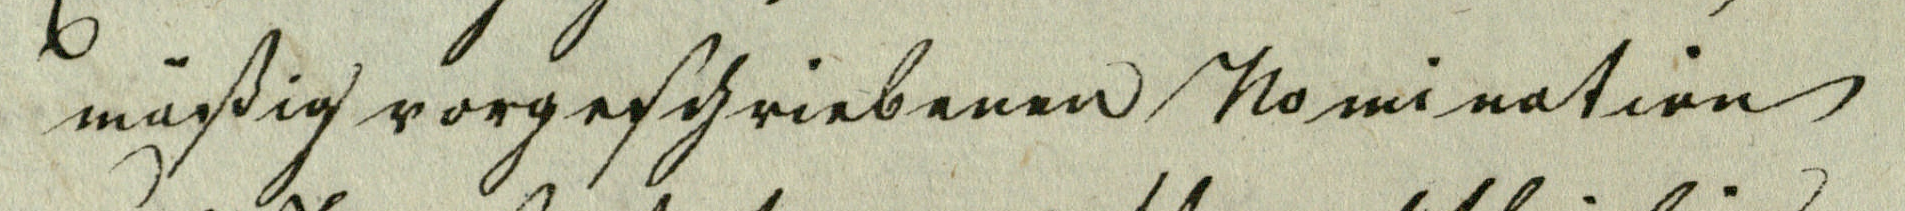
mäßig vorgeschriebenen Nomination
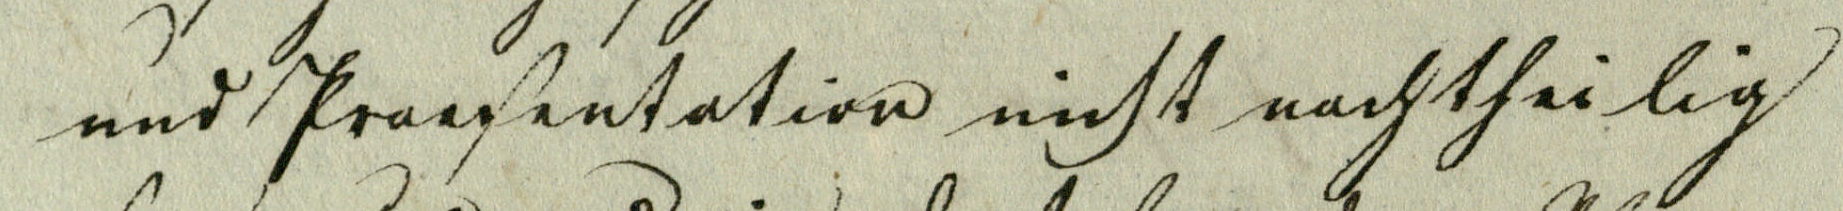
und Praesentation nicht nachtheilig
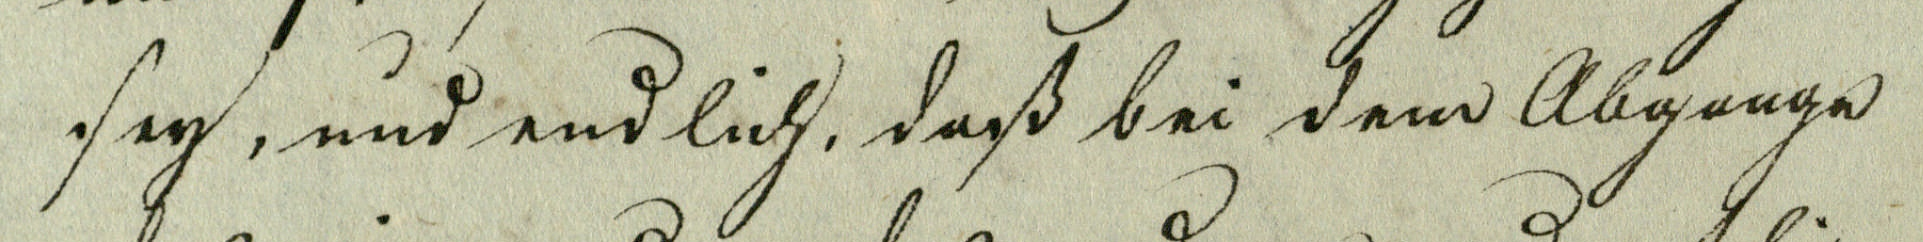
sey, und endlich, daß bei dem Abgange
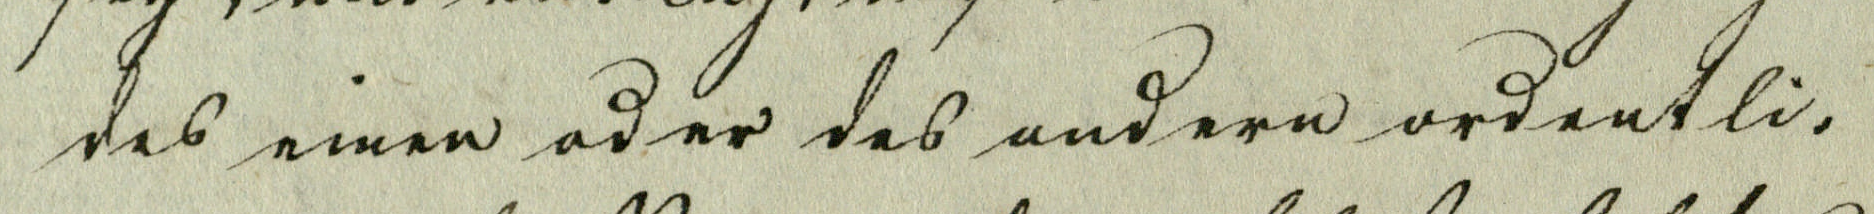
des einen oder des andern ordentli¬
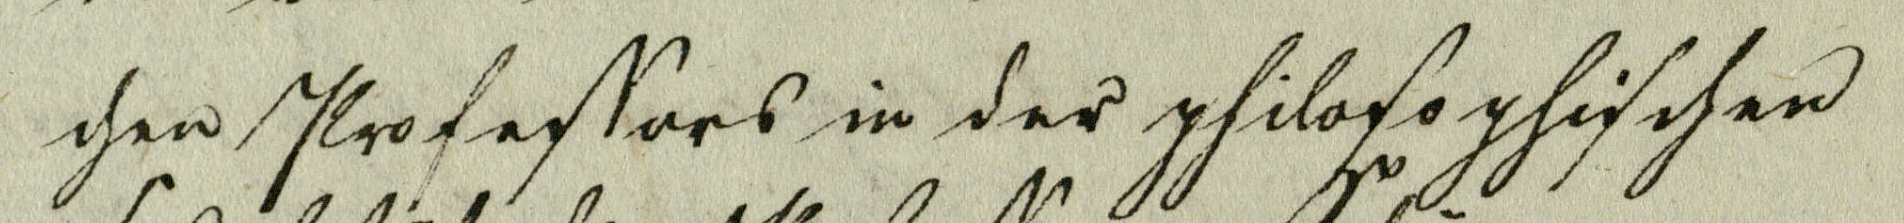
chen Professors in der philosophischen
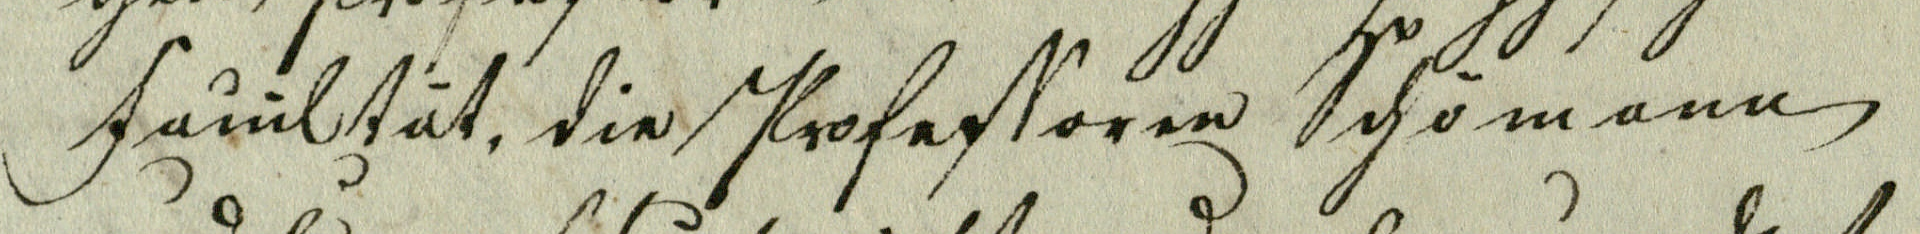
Facultät, die Professoren Schömann
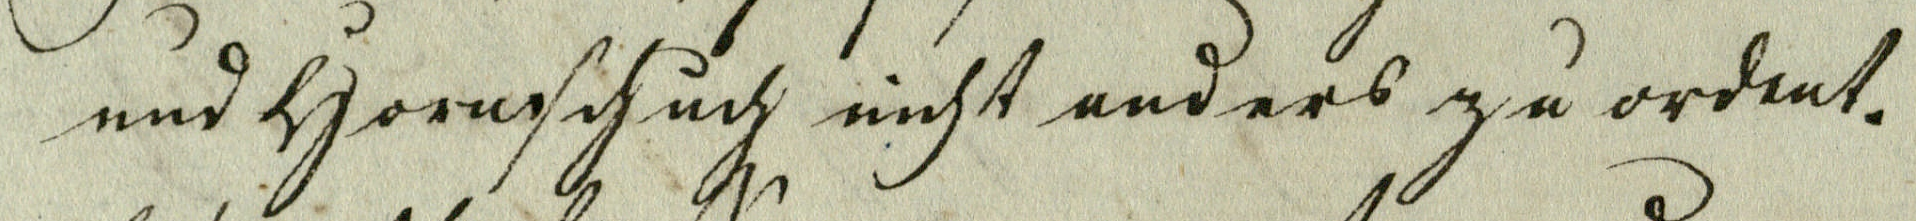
und Hornschuch nicht anders zu ordent¬
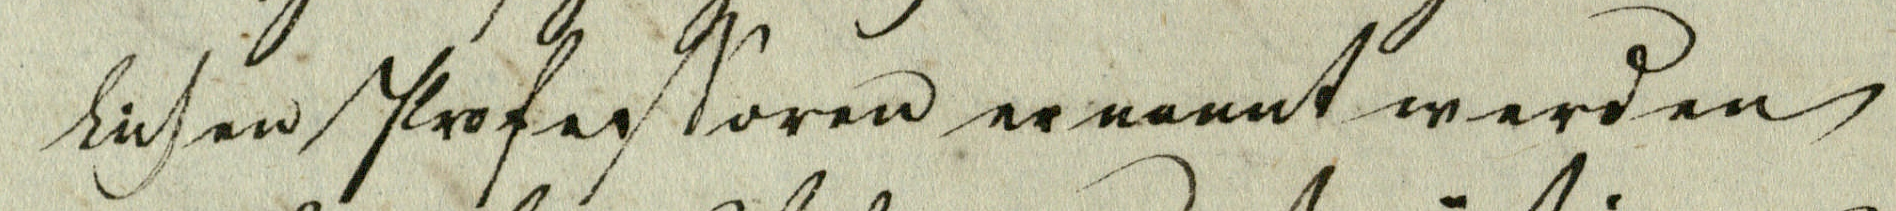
lichen Professoren ernannt werden
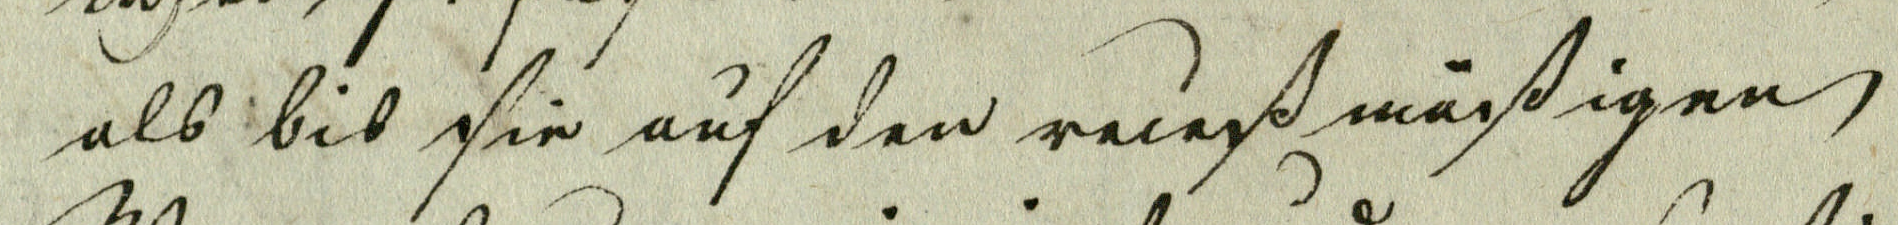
als bis sie auf den receßmäßigen
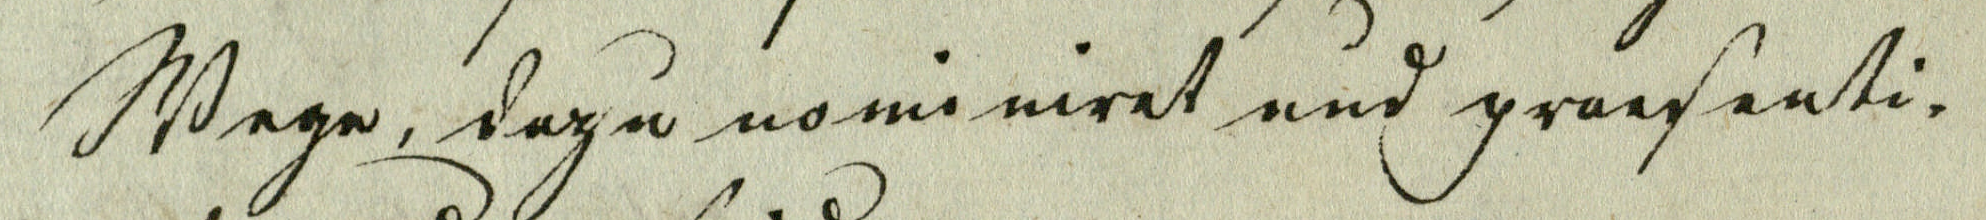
Wege, dazu nominiret und praesenti¬
